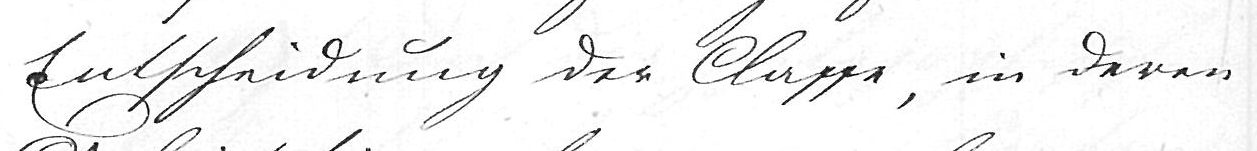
Entscheidung der Classe, in deren
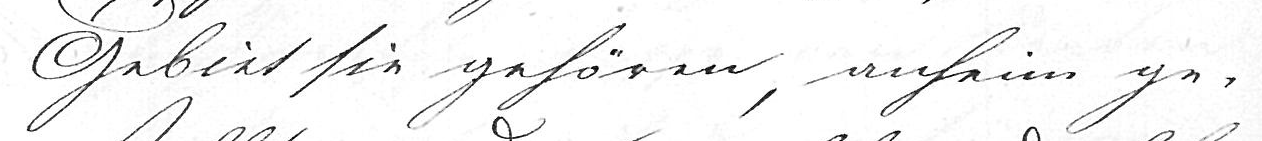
Gebiet sie gehören, anheim ge-
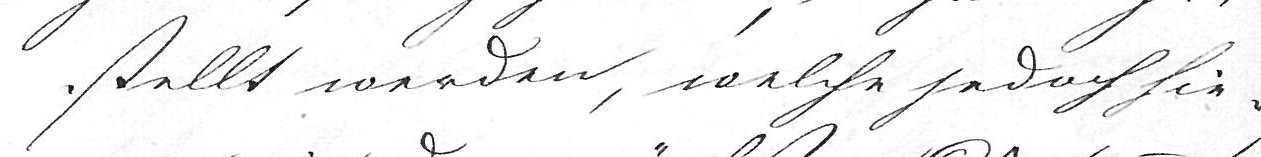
stellt werden, welche jedoch hie-
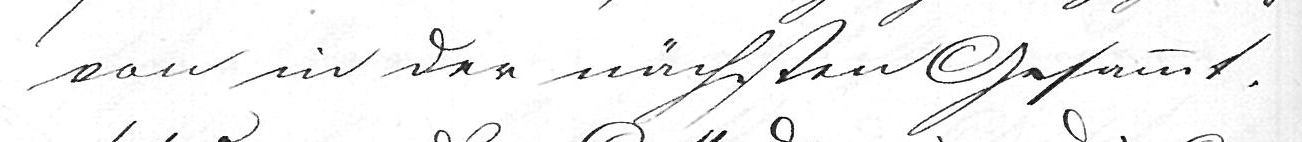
von in der nächsten Gesammt-
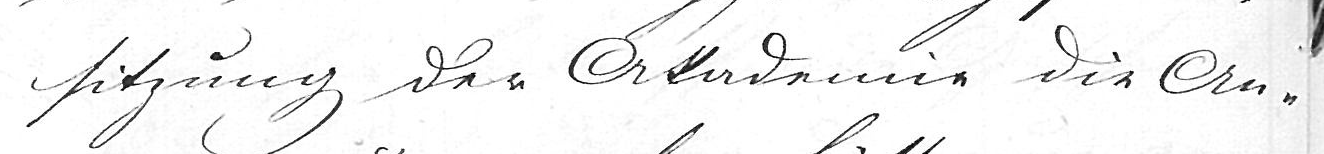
sitzung der Akademie die An-
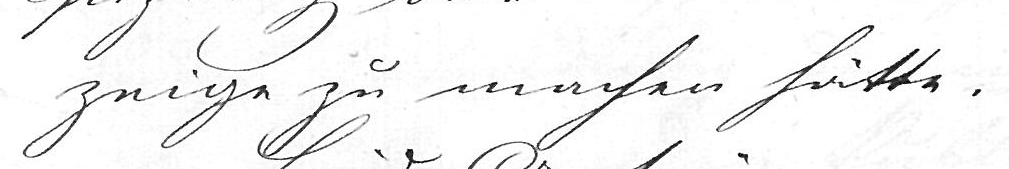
zeige zu machen hätte.
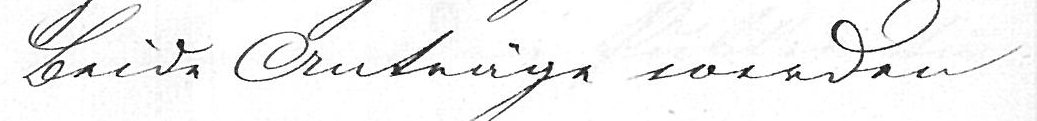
Beide Anträge werden
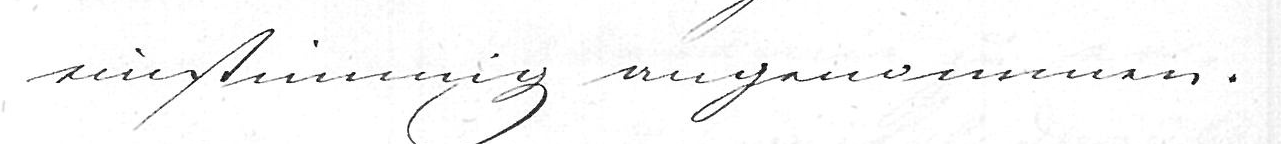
einstimmig angenommen.
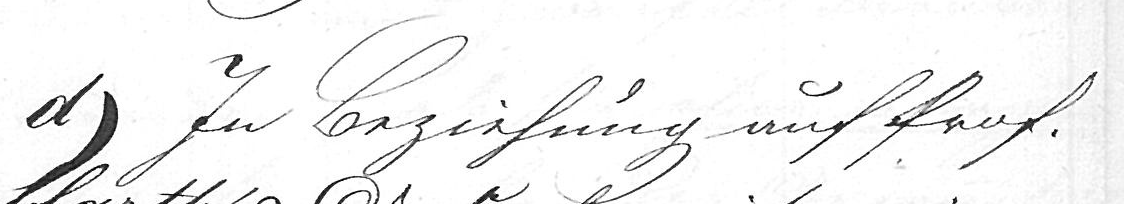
d) In Beziehung auf Prof.
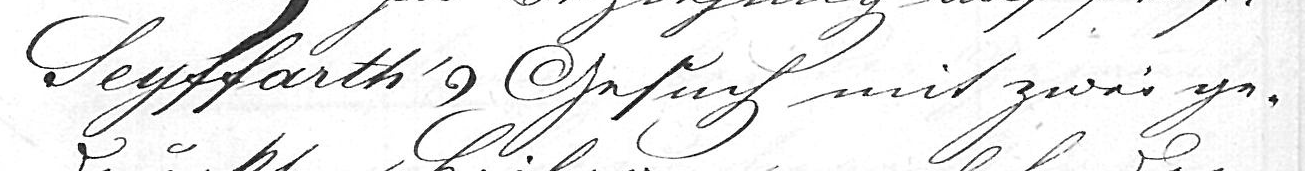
Seyffarth's Gesuch mit zwei ge-
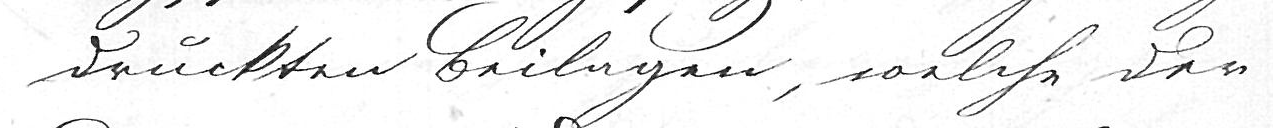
druckten Beilagen, welche der
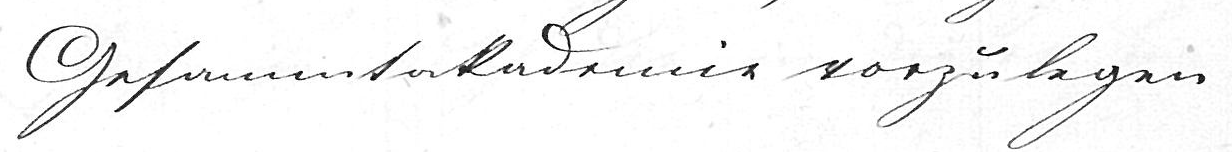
Gesammtkademie vorzulegen
